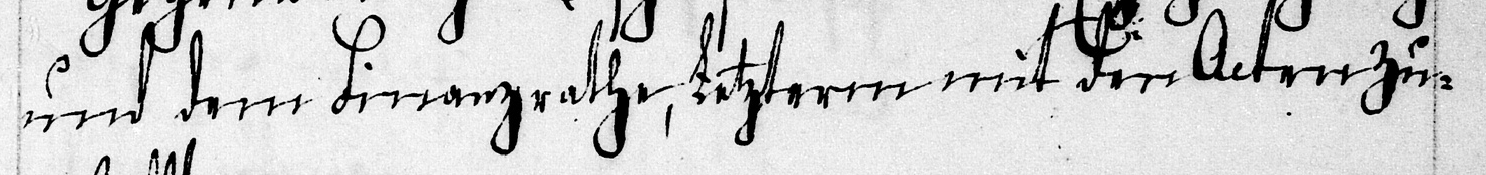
und dem Finanzrathe, Letzterm mit den Acten zu¬
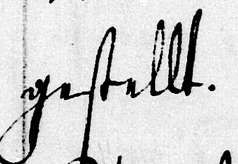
gestellt.
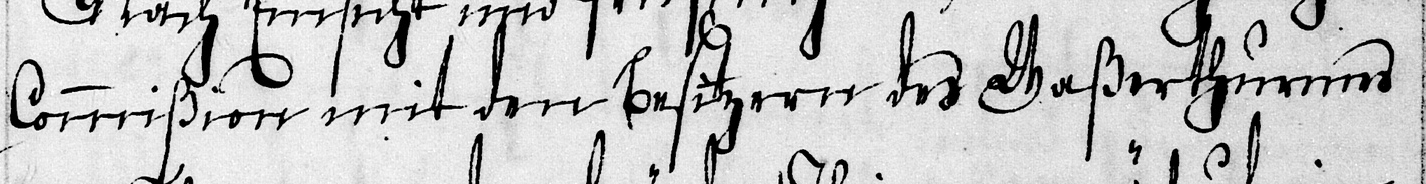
ommißion mit den Besitzern des Waßerthurmes
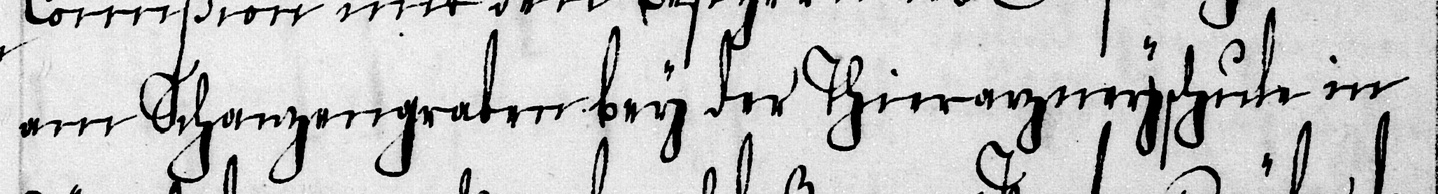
am Schanzengraben bey der Thierarzneyschule in
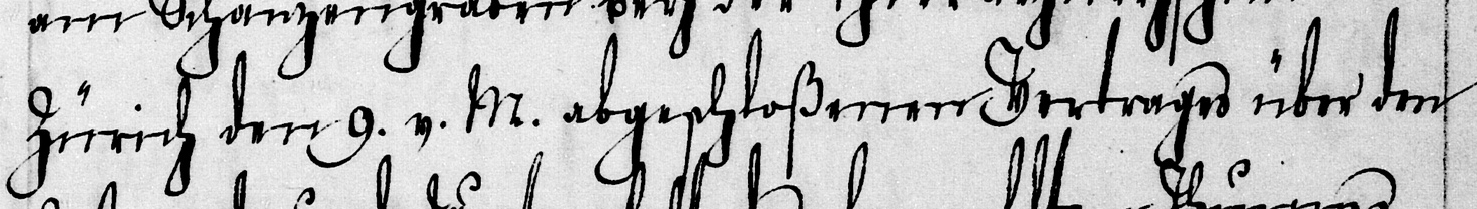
Zürich den 9. v. M. abgeschloßenen Vertrages über den
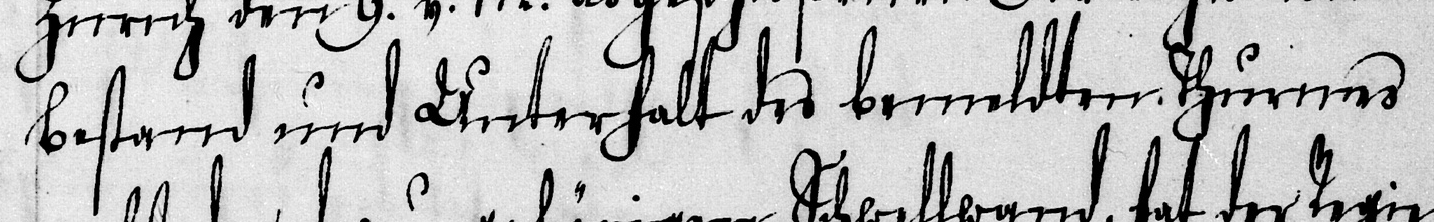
Bestand und Unterhalt des bemeldten Thurmes
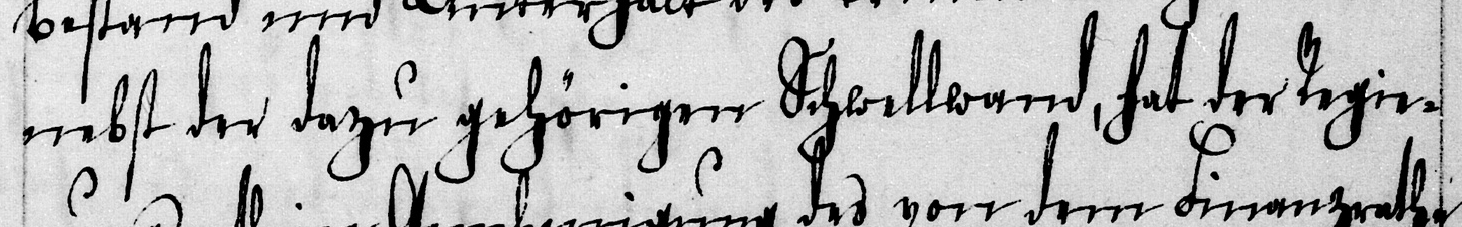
nebst der dazu gehörigen Schwellwand, hat der Regie¬
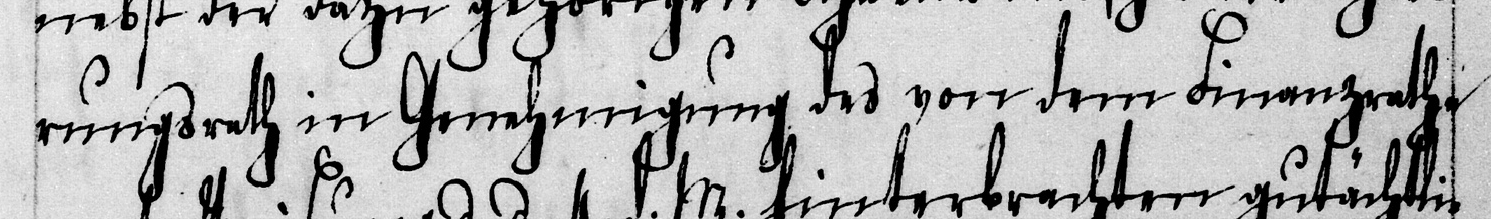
rungsrath in Genehmigung des von dem Finanzrathe
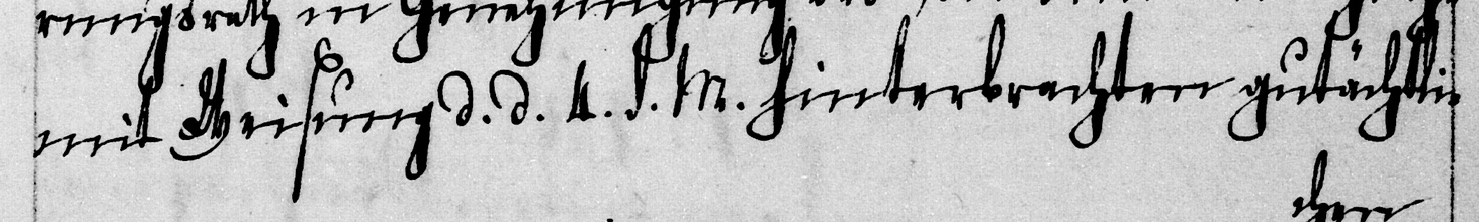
mit Weisung d. d. 4. d. M. hinterbrachten gutächtli-
